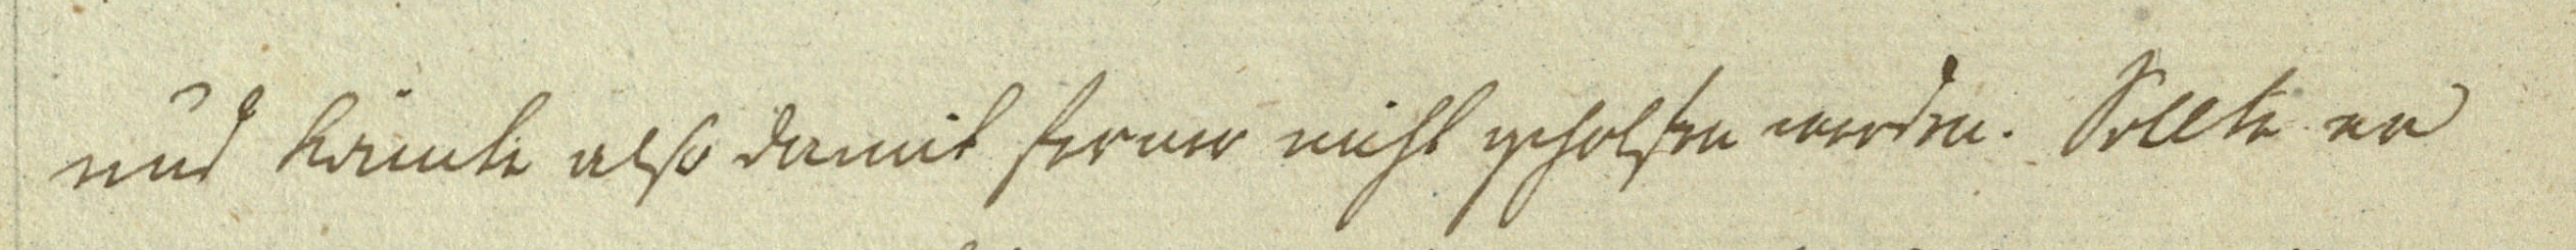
und könnte also damit ferner nicht geholfen werden. Sollte er
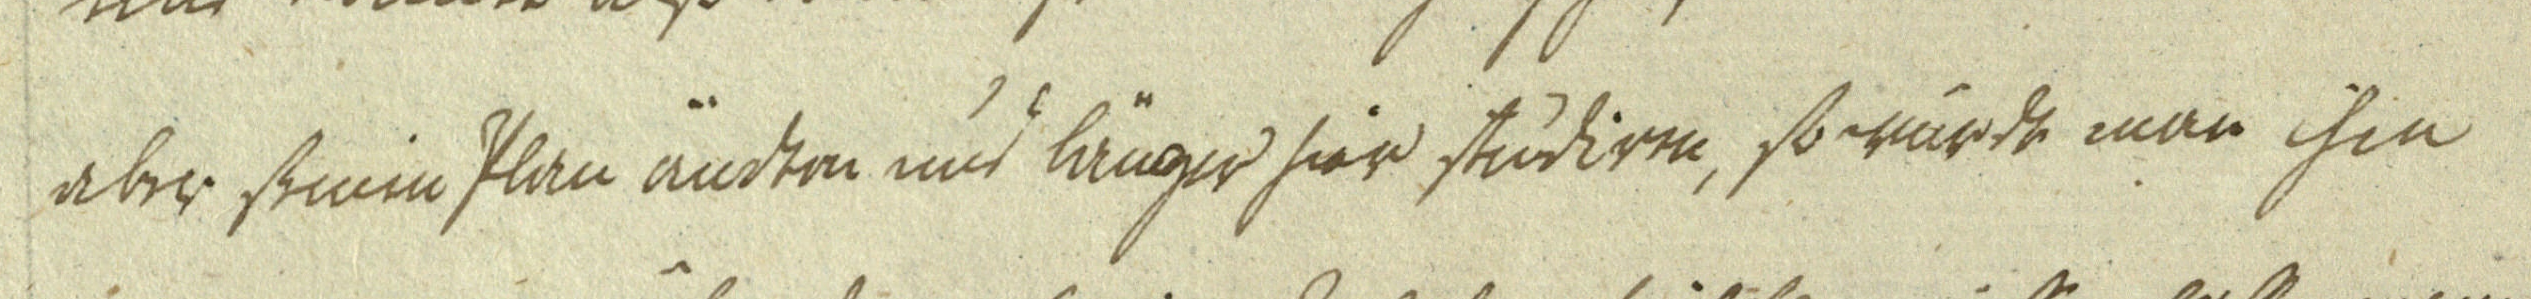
aber seinen Plan ändern und länger hier studiren, so würde man ihm
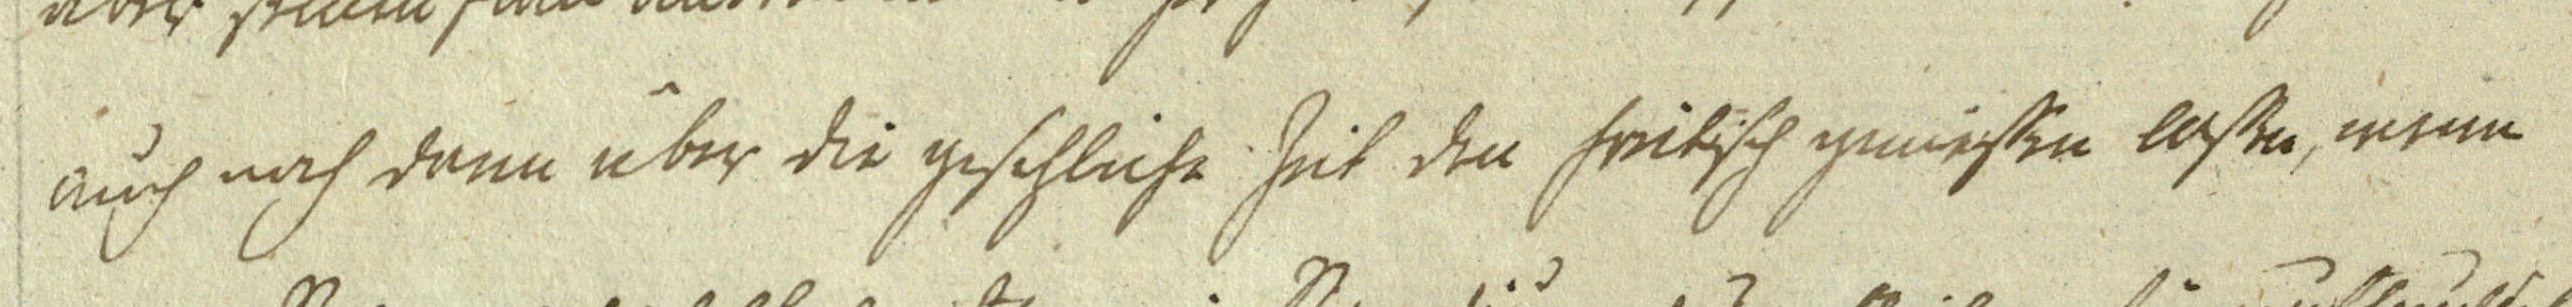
auch noch dann über die gesetzliche Zeit den Freitsch geniessen lassen, wenn
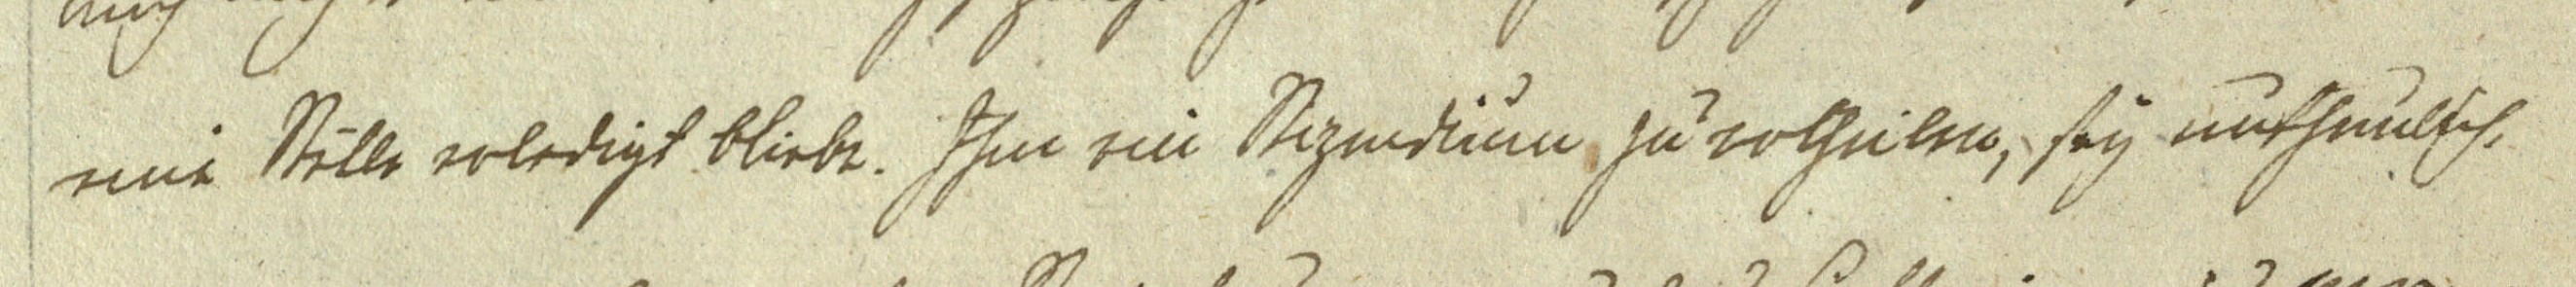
eine Stelle erledigt bliebe. Ihm ein Stipendium zu ertheilen, seÿ unthunlich,
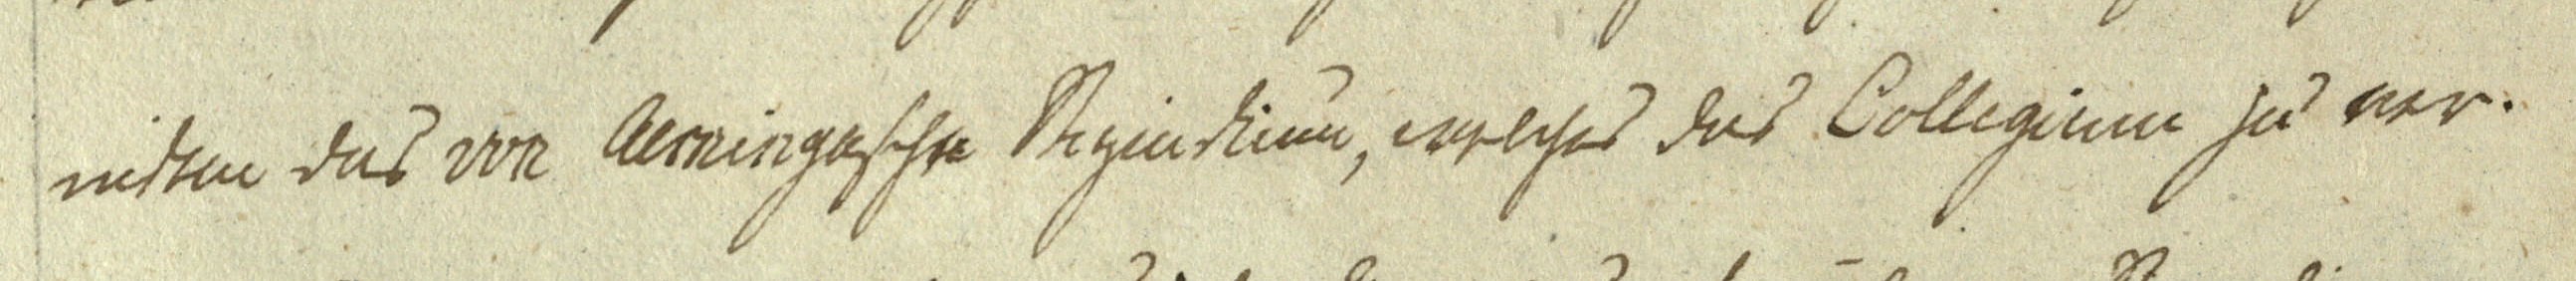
indem das von Aemingasche Stipendium, welches das Collegium zu ver¬
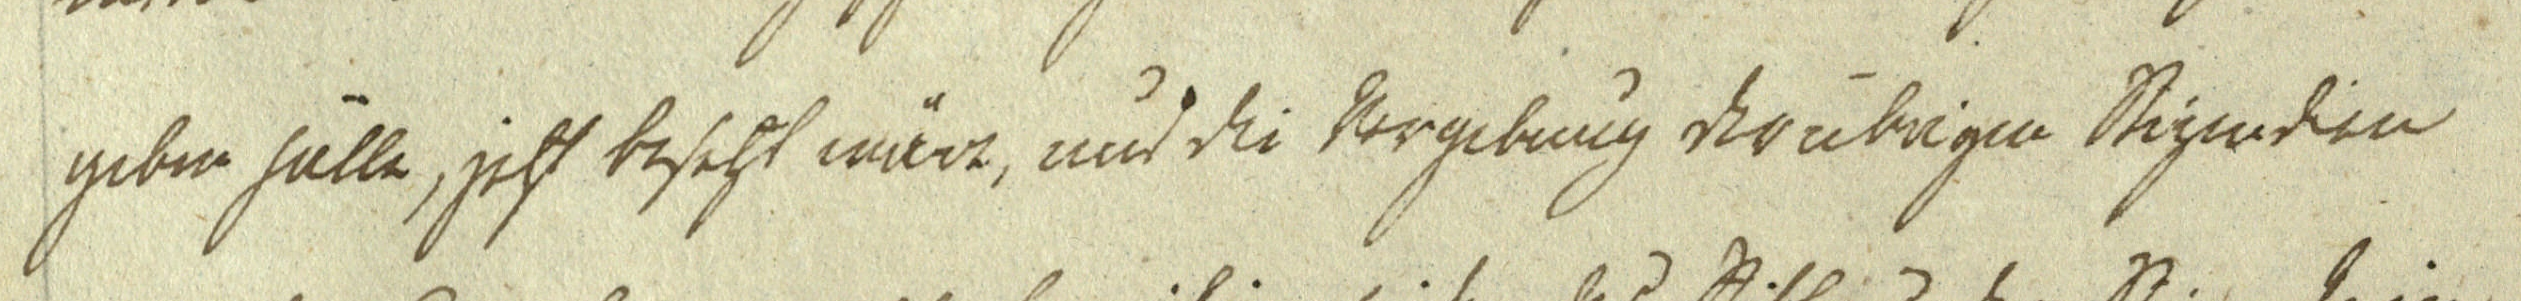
geben hätte, jetzt besetzt wäre, und die Vergebung der übrigen Stipendien
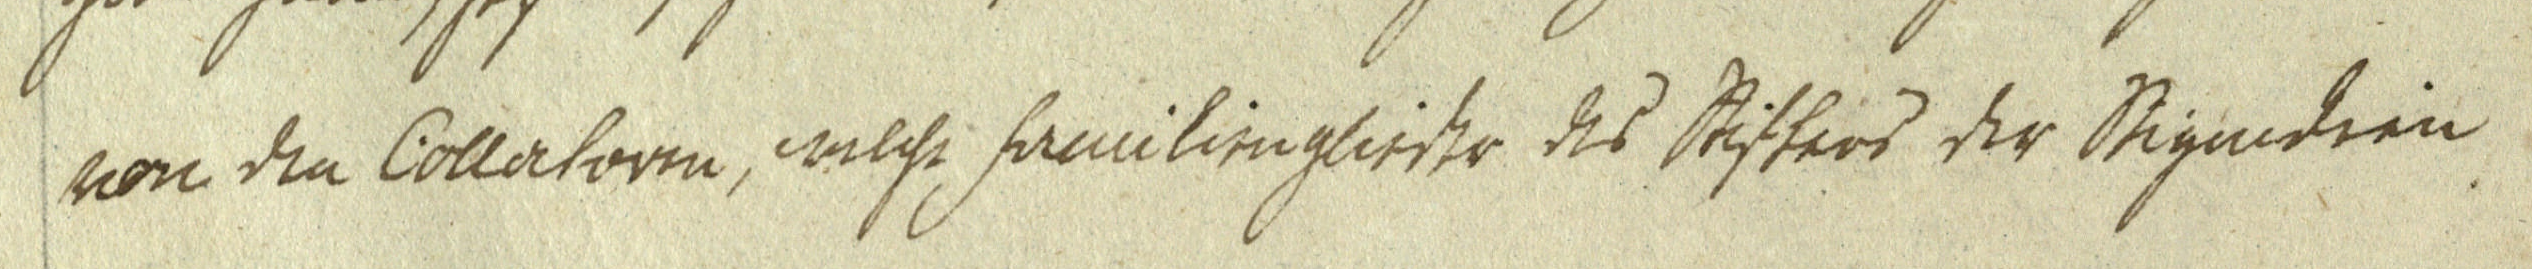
von den Collatoren, welche Familienglieder des Stifters der Stipendien
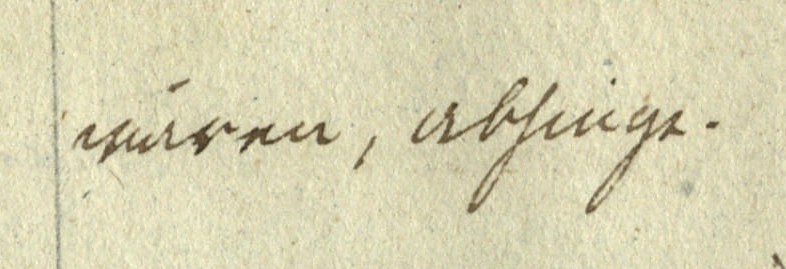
wären, abhinge.
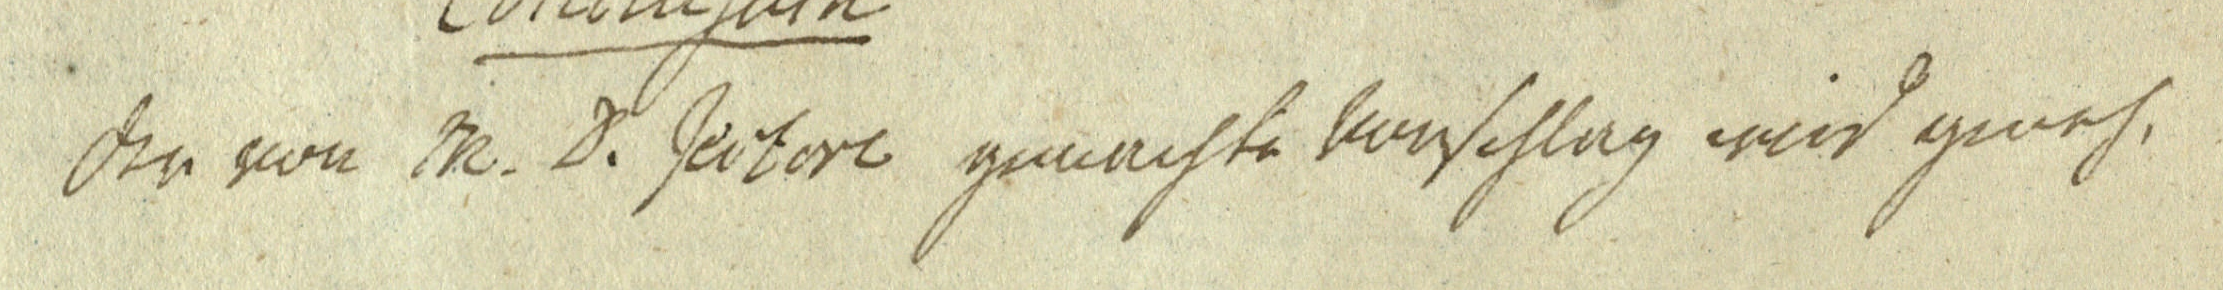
Der von M. D. Rectore gemachte Vorschlag wird geneh¬
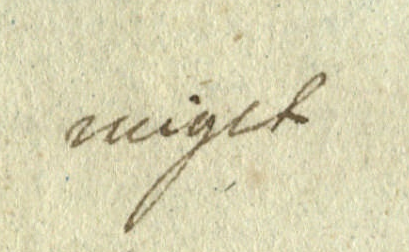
miget.
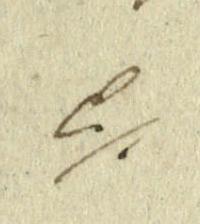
c/.
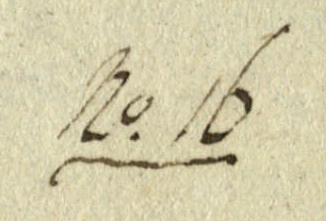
No 16
